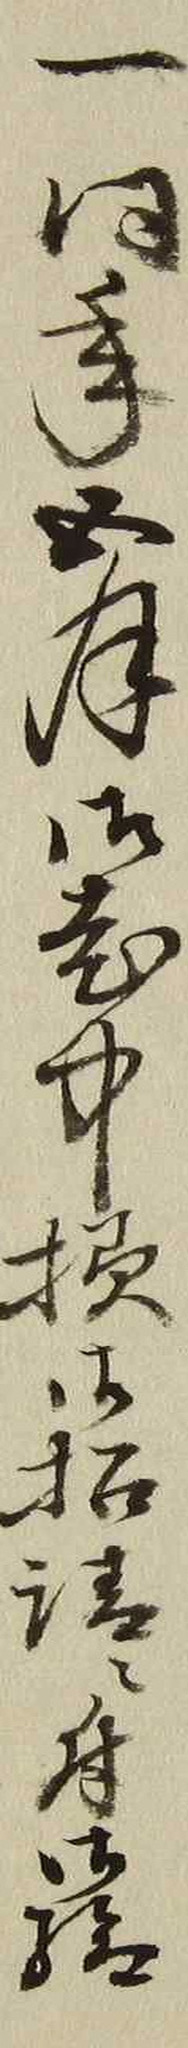一同年五月御老中様御招請ニ付御給
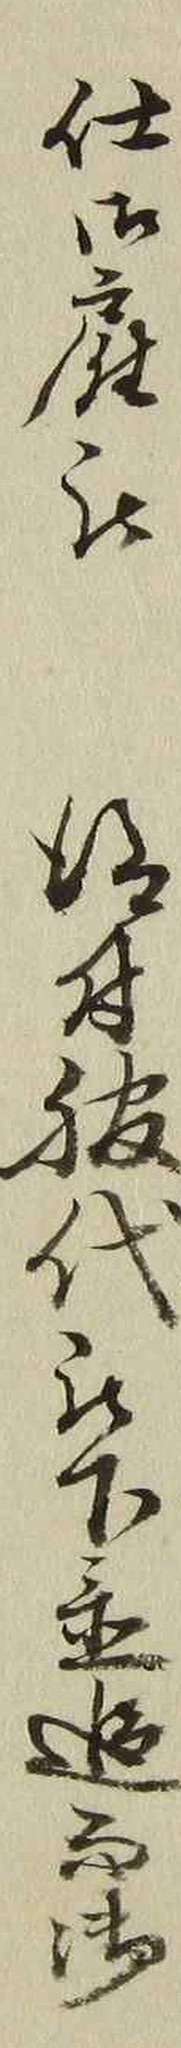仕御雇被仰付服代被下置追而御
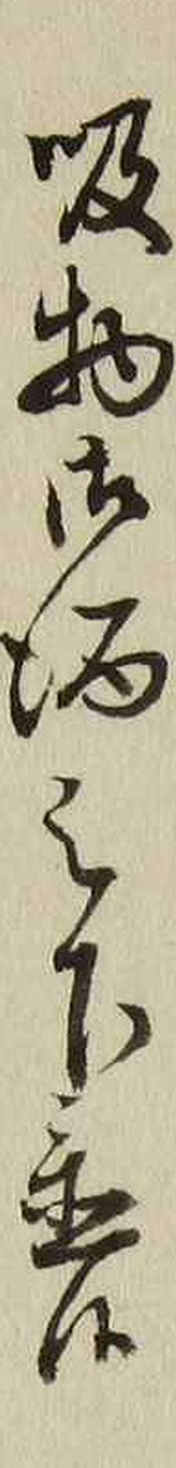吸物御酒被下置候
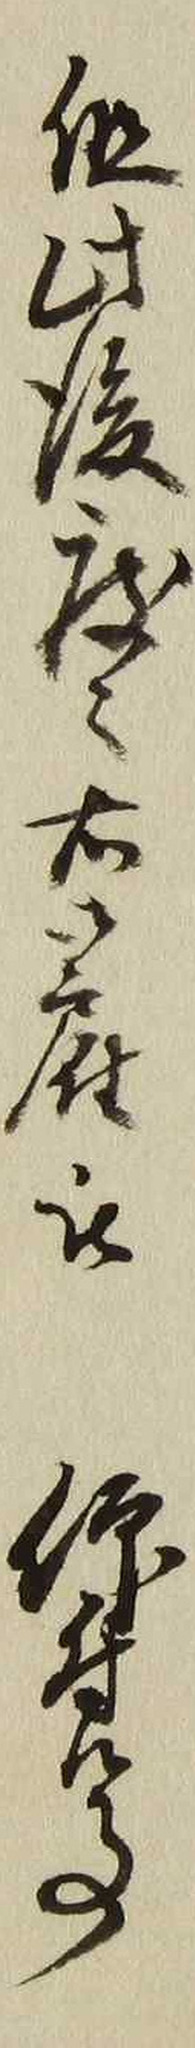但此後度々右雇被仰付候事
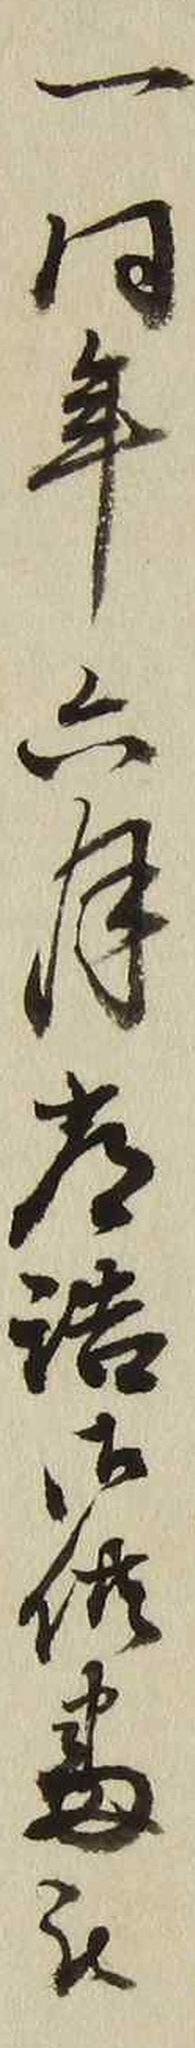一同年六月常詰御供番被
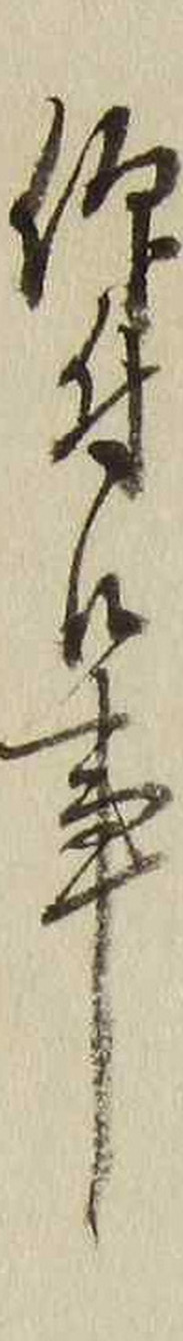仰付候事
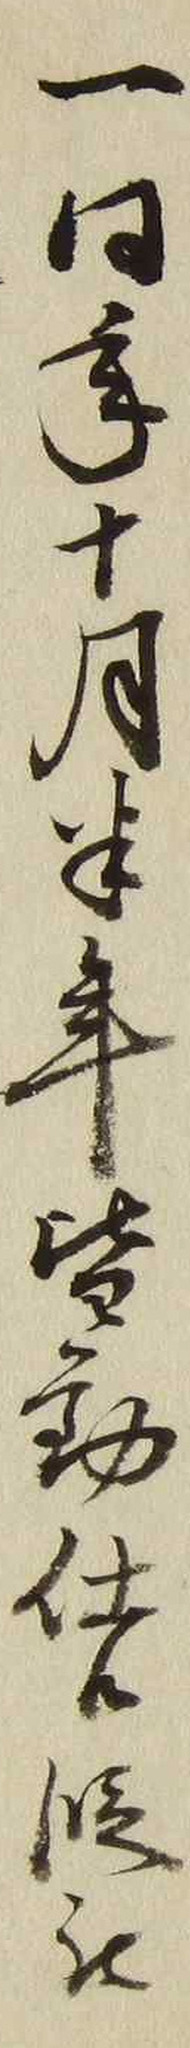一同年十月半年皆勤仕候段被
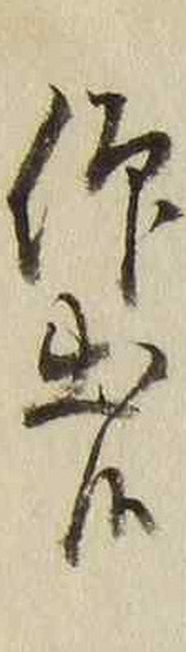仰出候

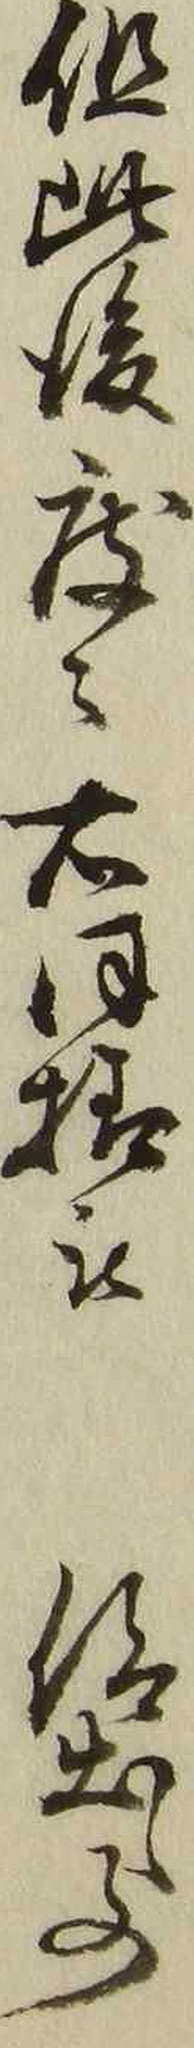但此後度々右同様被仰出候事
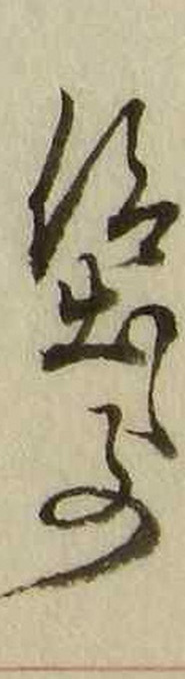仰出候事
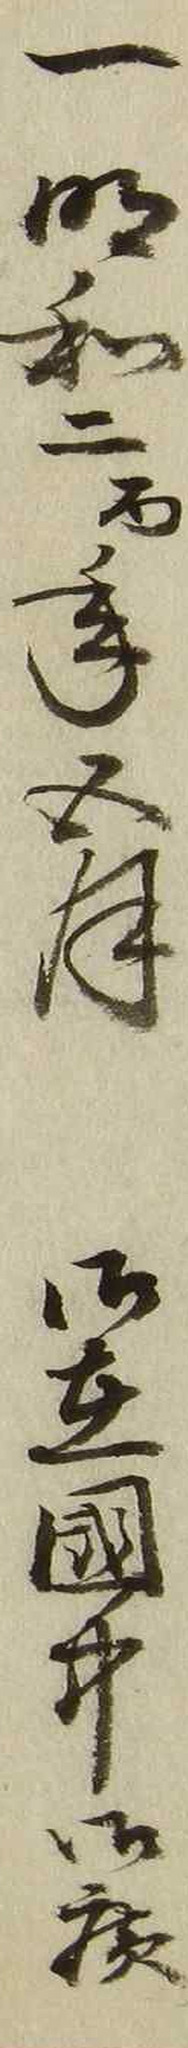一明和二酉年五月御在国中御広
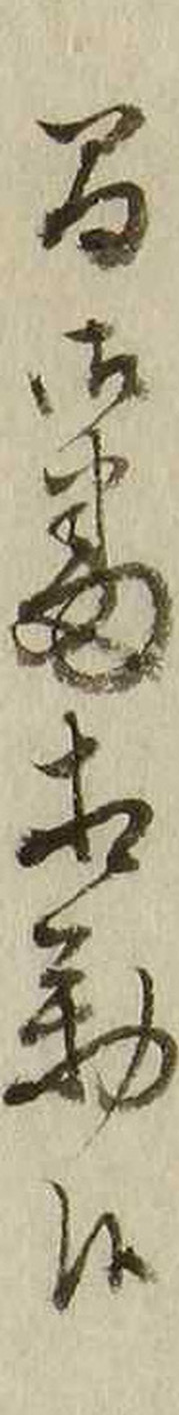間御番相勤候
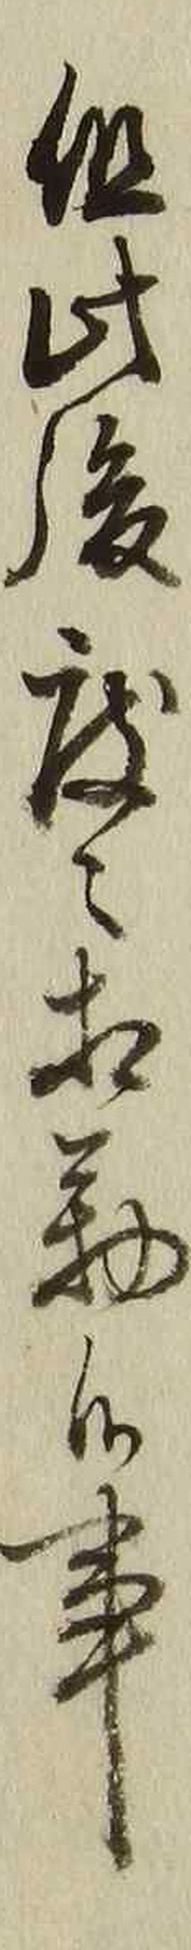但此後度々相勤候事
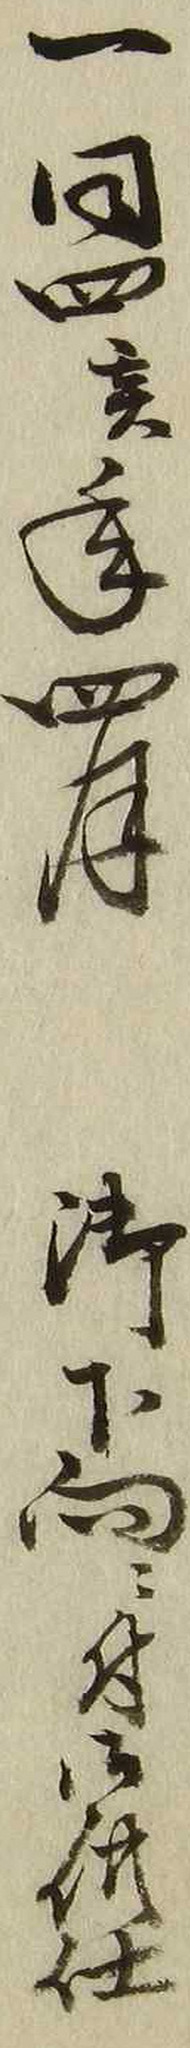一同四亥年四月御下向ニ付御供仕
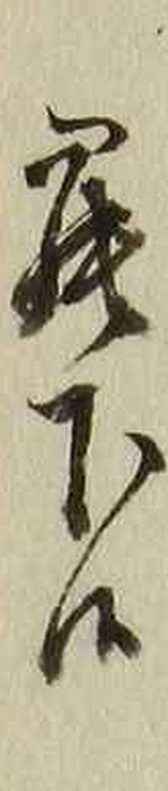罷下候
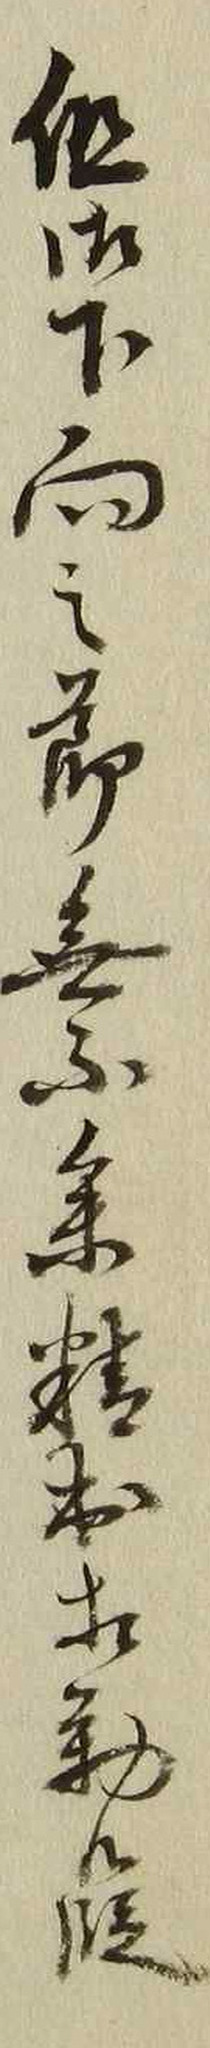但御下向之節無不参精出相勤候段
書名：諸士系譜　巻之35　は之部3
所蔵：会津若松市立会津図書館
